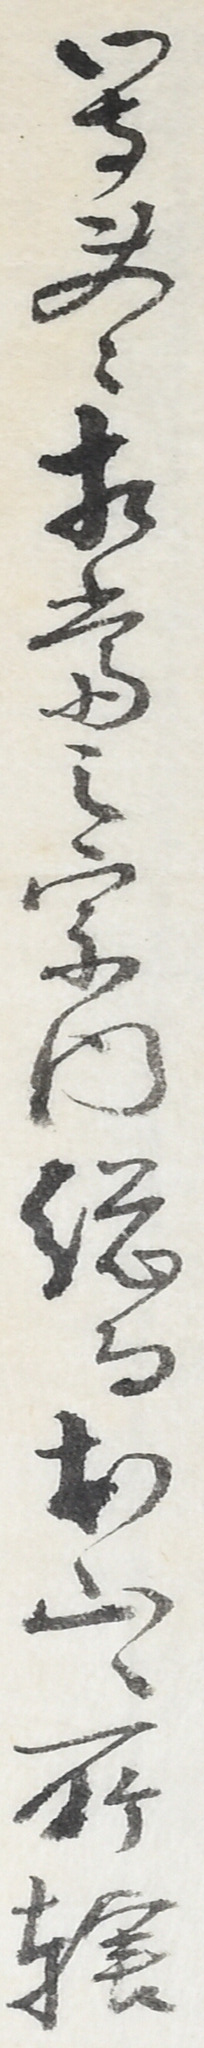等夫々相当之宗内総て本山へ所轄

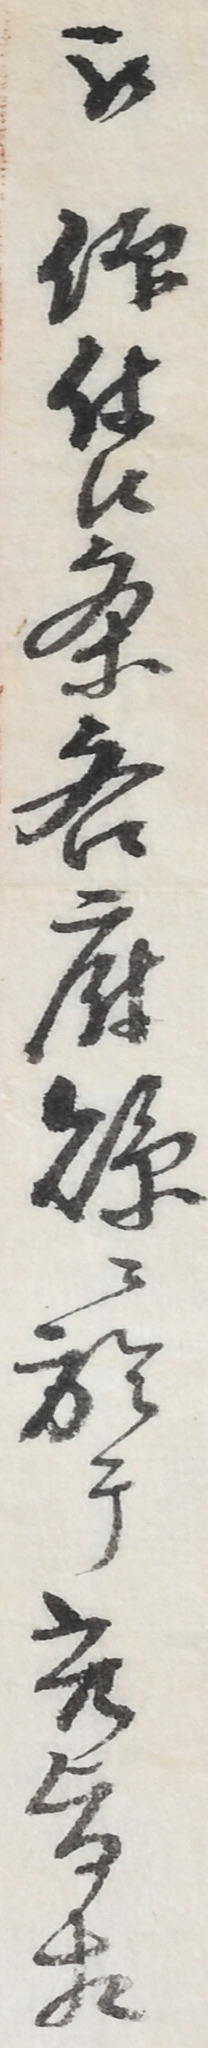被仰付候条各府県に於て此旨相
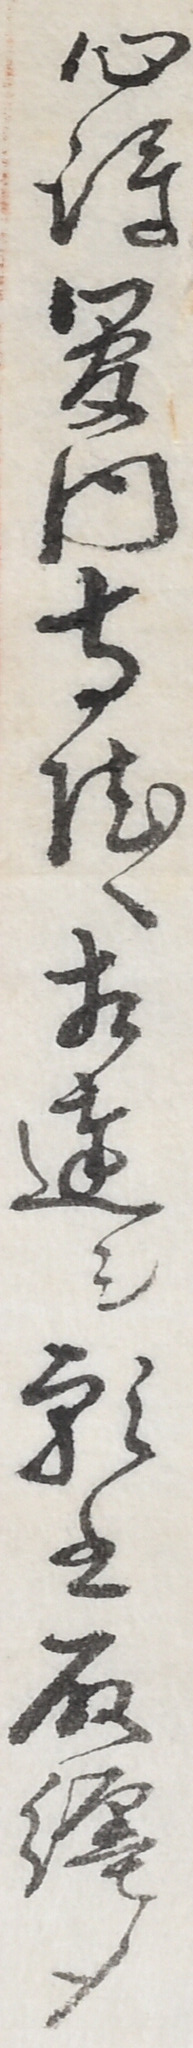心得管内寺院へ相達し願書取纏め
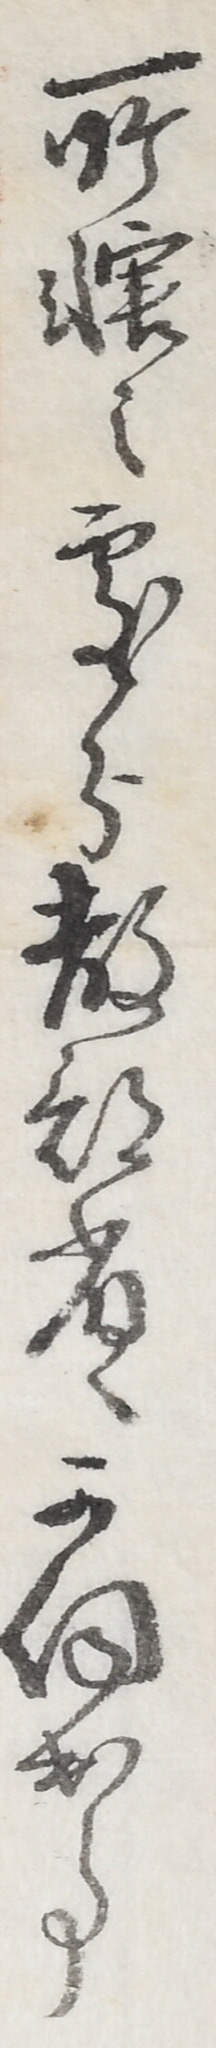所轄之処分教部省へ可伺出事
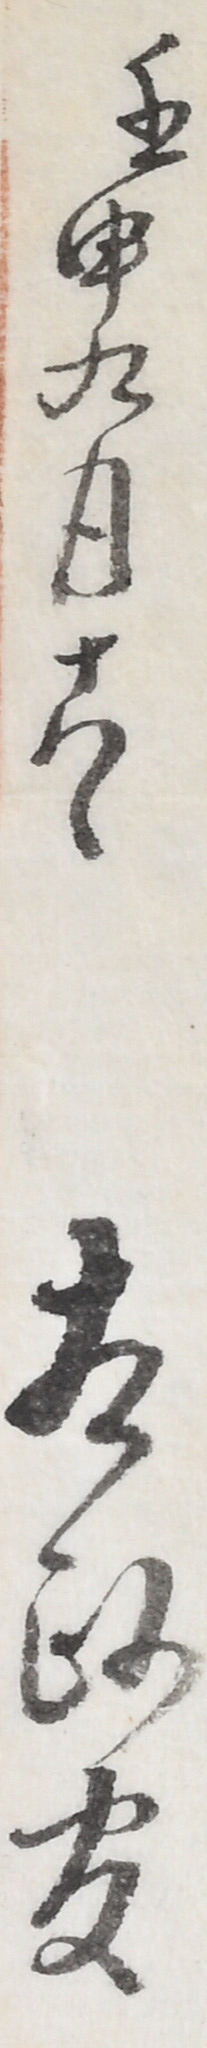丑申九月十八日太政官
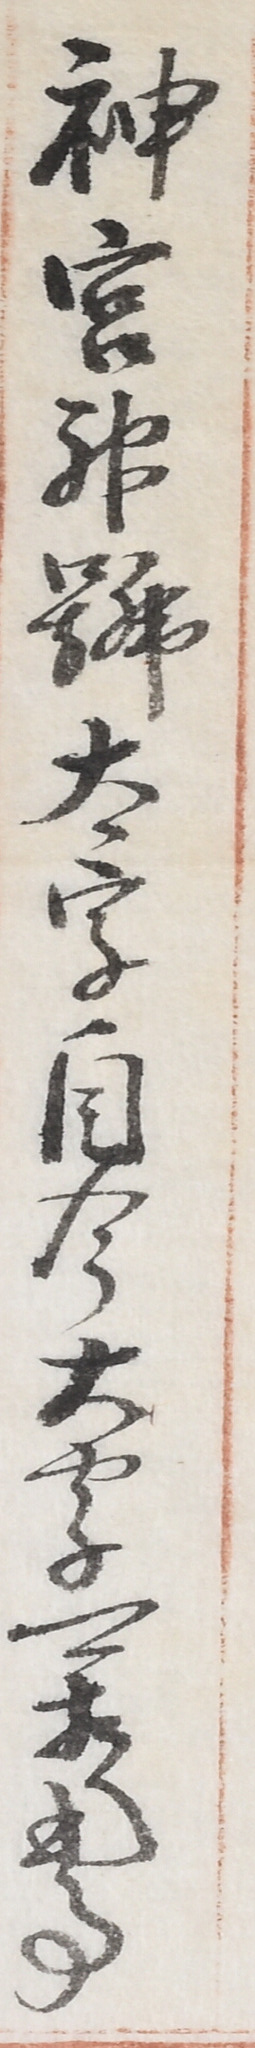神宮神号太字自今大字可相用事
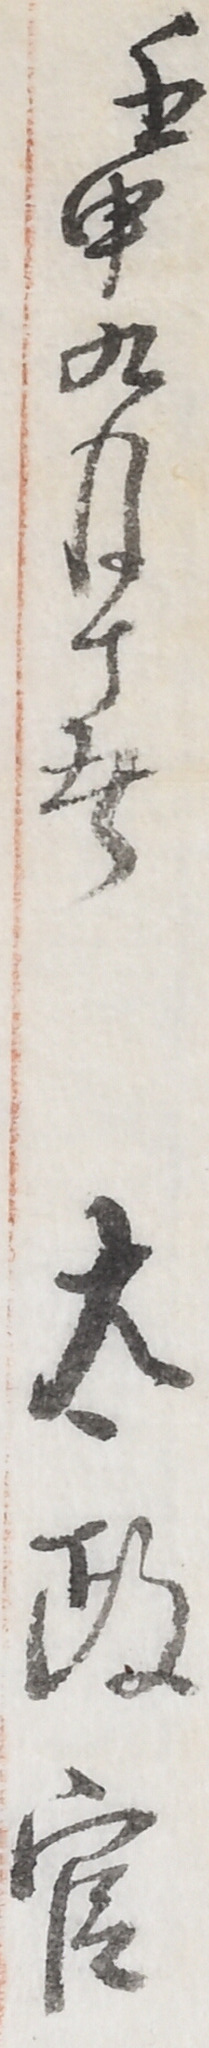壬申九月十五日太政官
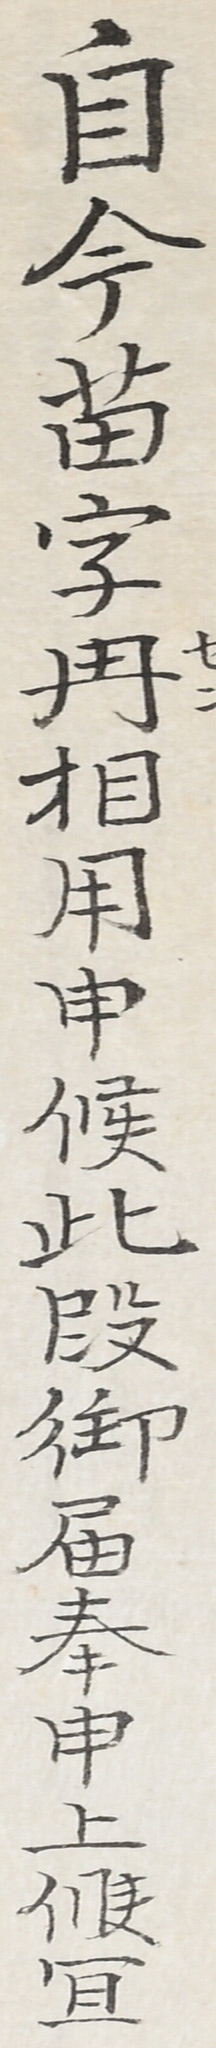自今苗字冉相用申候此段御届奉申上候宜
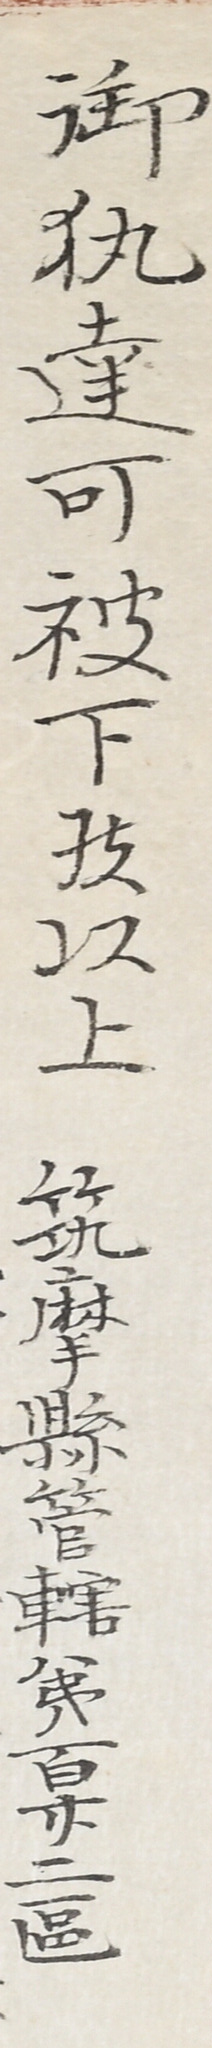御執達可被下候以上筑摩県管轄第百廿二区
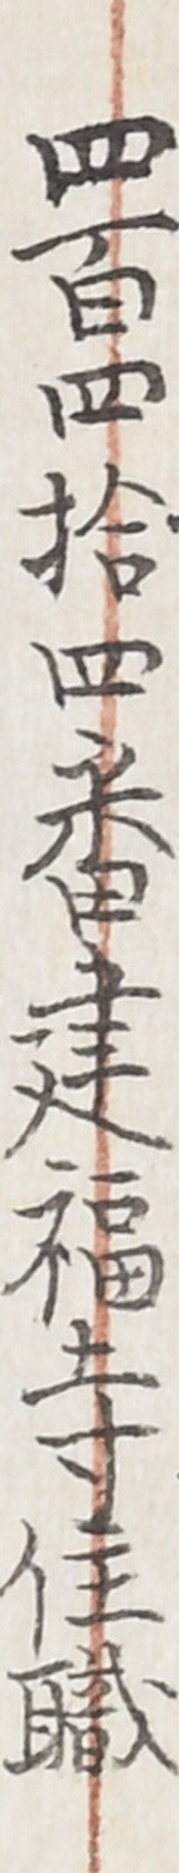四百四拾四番建福寺住職
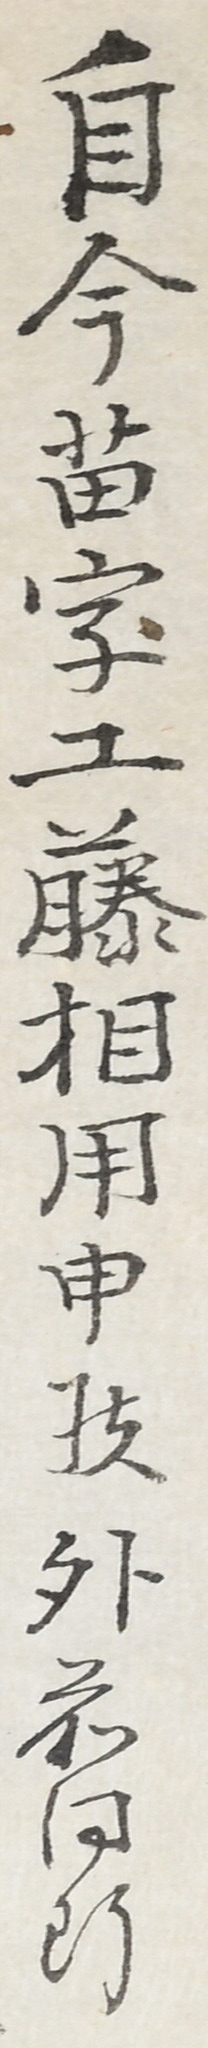自今苗字工藤相用申候外前同断
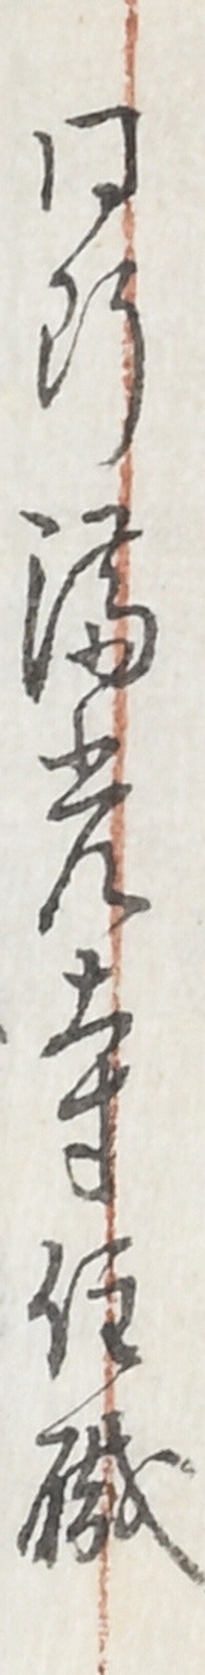同断満光寺住職

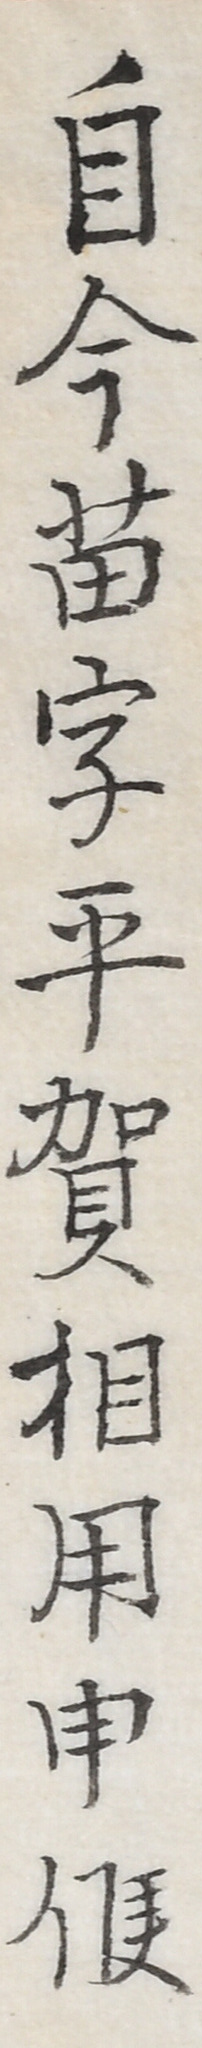自今苗字平賀相用申候
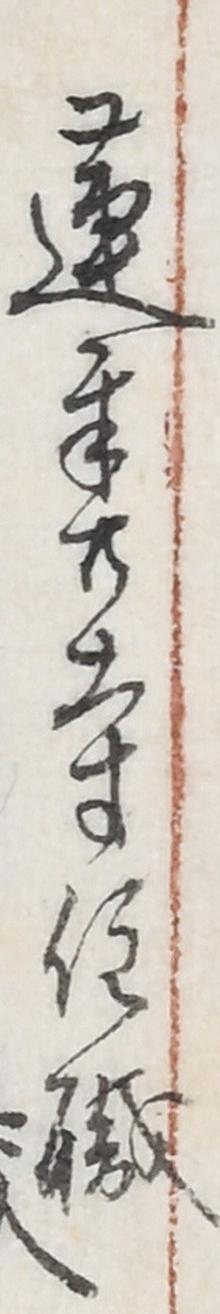蓮華廿寺住職
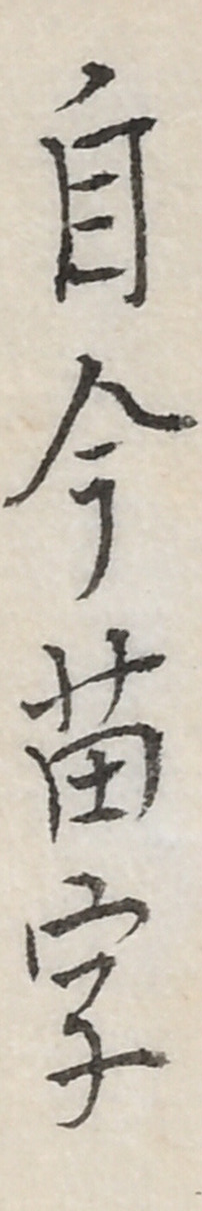自今苗字
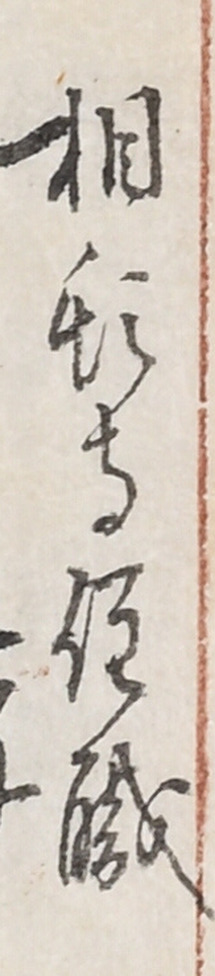相頓寺住職
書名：壹番・御布告一式
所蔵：伊那市立高遠町図書館・合同会社AMANE
